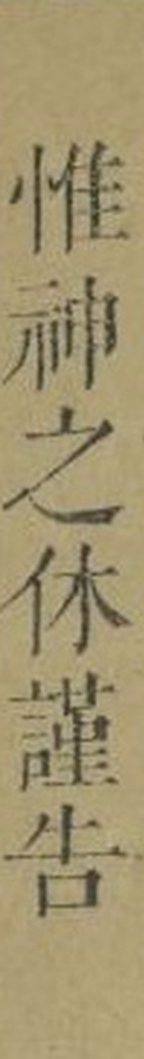惟神之休謹告
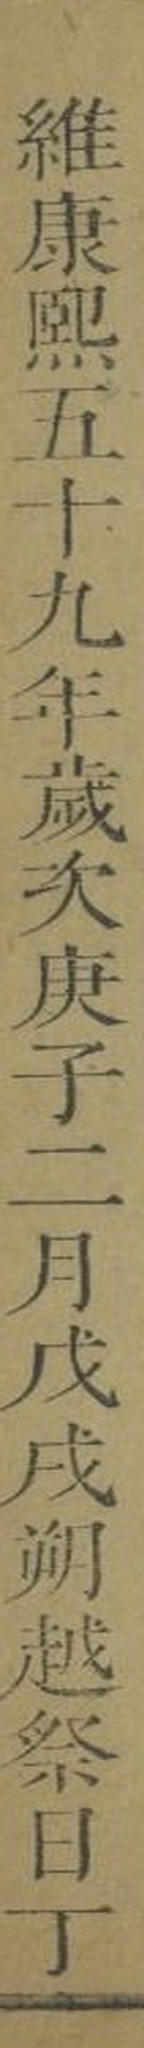維康熙五十九年歲次庚子二月戊戌朔越祭日丁

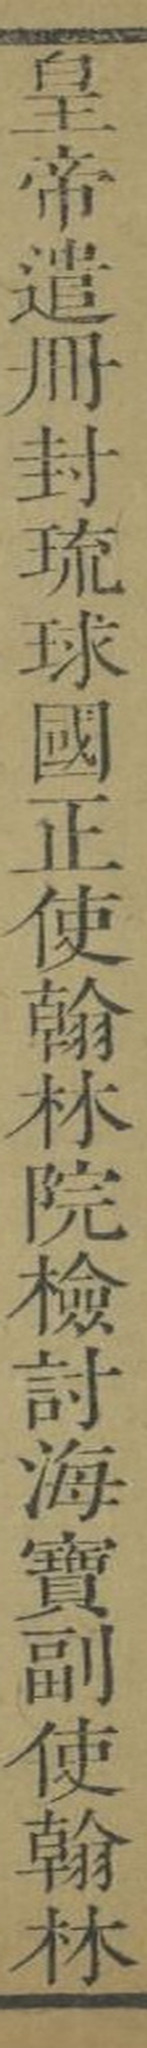皇帝遣冊封琉球國正使翰林院檢討海寶副使翰林
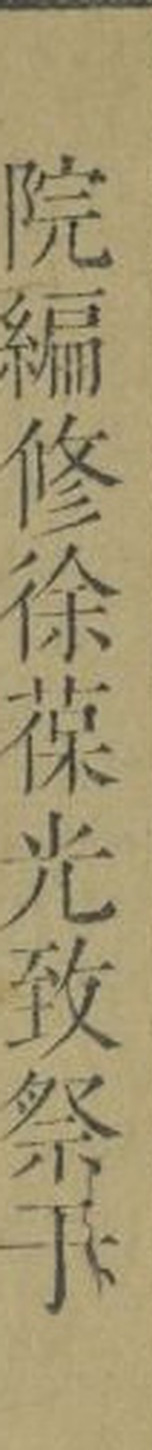院編修徐葆光致祭于
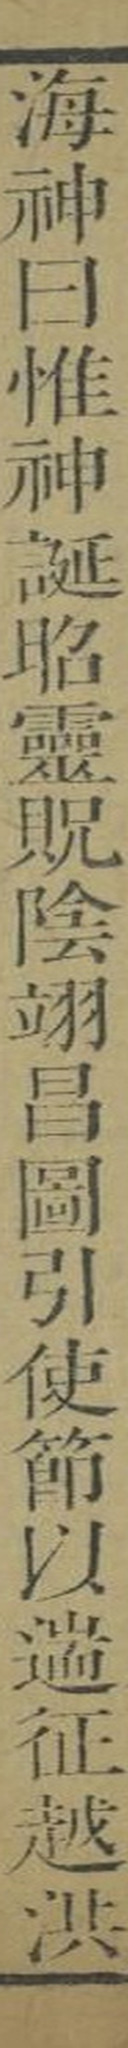海神曰惟神誕昭靈貺陰翊昌圖引使節以遄征越洪
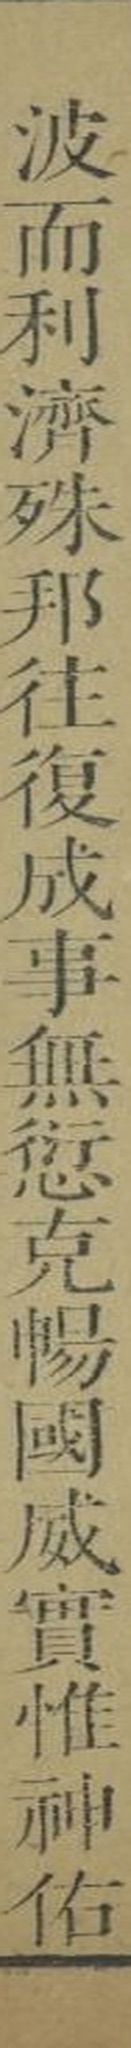波而利濟殊邦往復成事無愆克暢國威實惟神佑
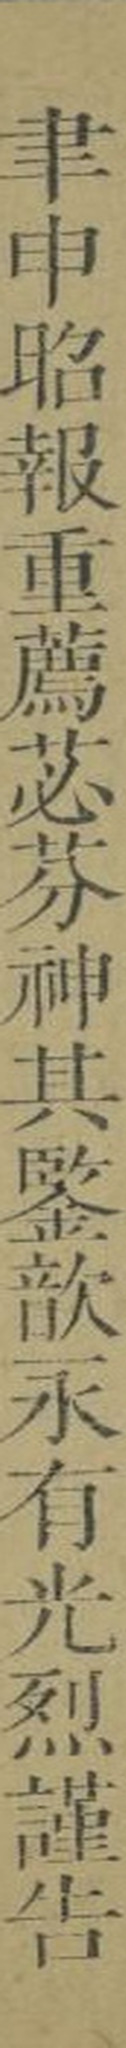聿申昭報重薦苾芬神其鍳歆永有光烈謹告
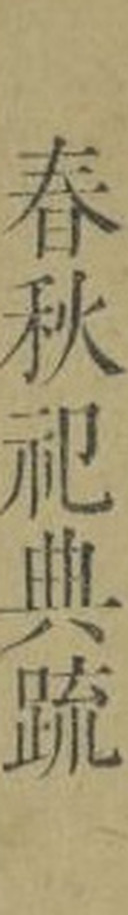春秋祀典䟽
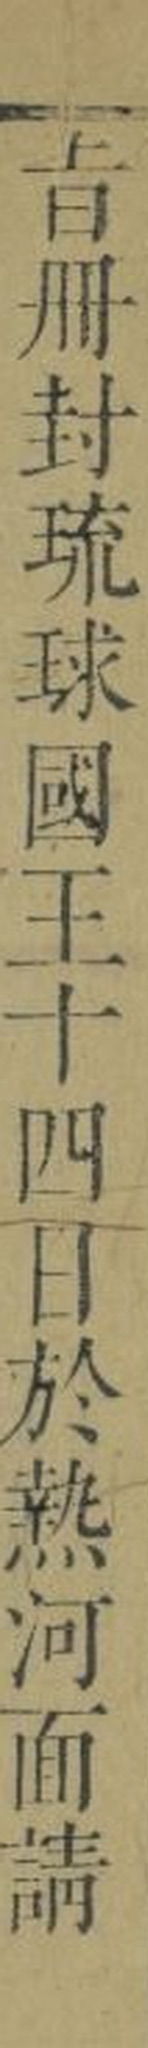㫖冊封琉球國王十四日於𤍠河面請
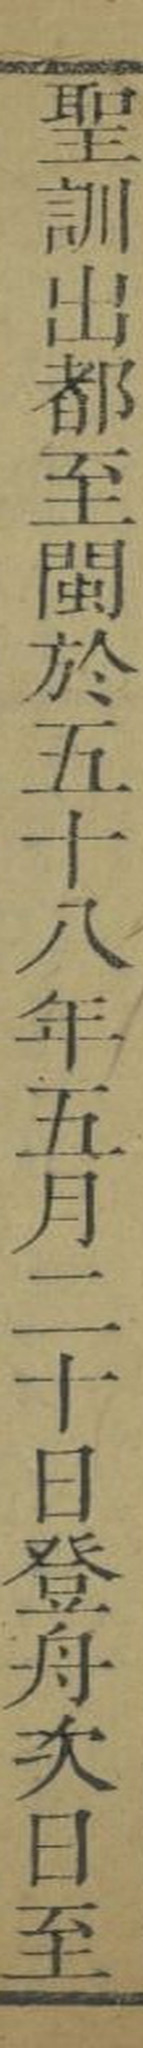聖訓出都至閩於五十八年五月二十日登舟次日至
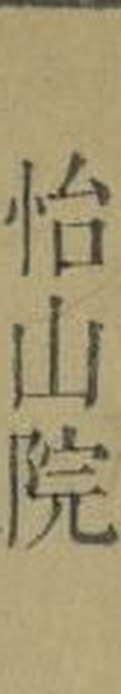怡山院
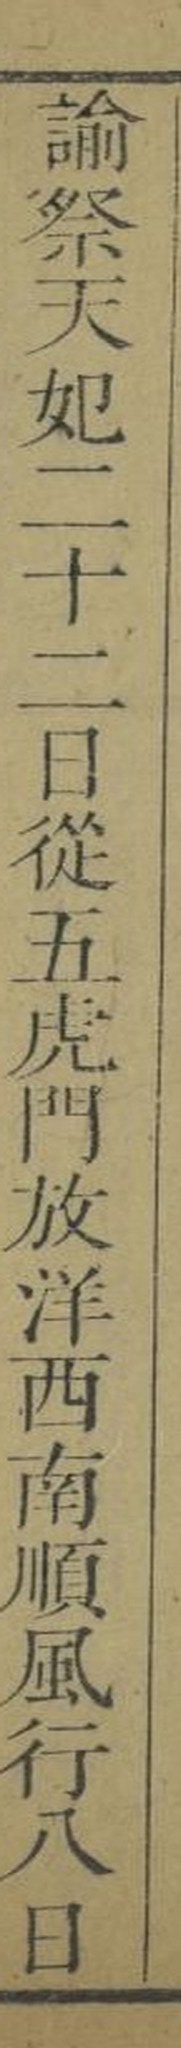諭祭天妃二十二日從五虎門放洋西南順風行八日
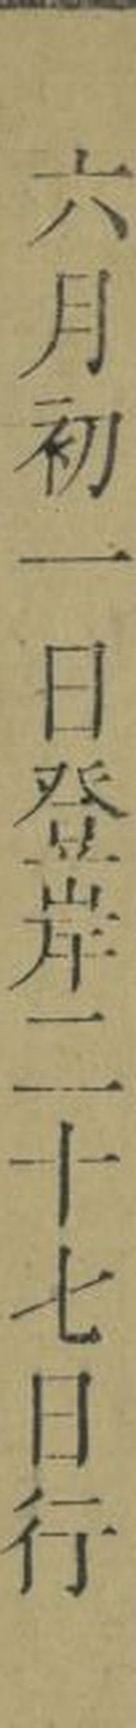六月初一日登岸二十七日行
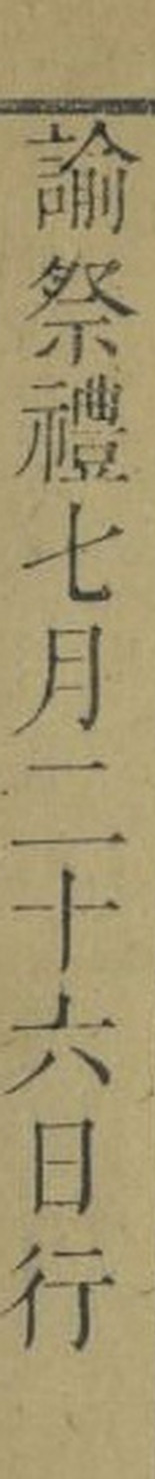諭祭禮七月二十六日行
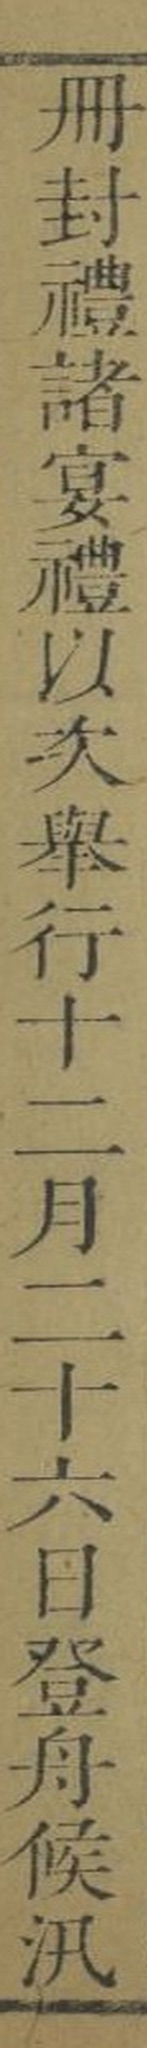冊封禮諸宴禮以次舉行十二月二十六日登舟候汛

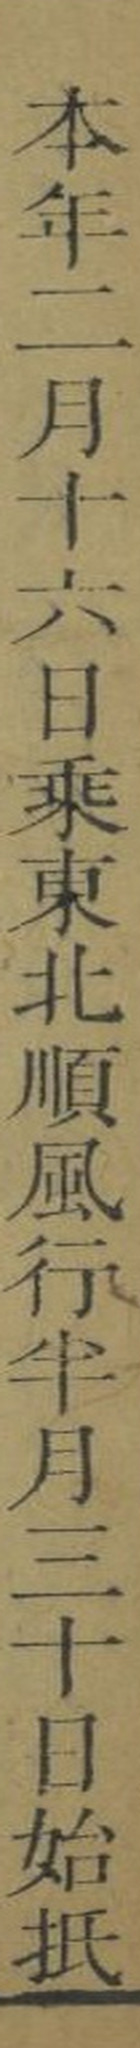本年二月十六日乘東北順風行半月三十日始扺
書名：中山伝信録 巻一
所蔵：University of the Ryukyus Library
